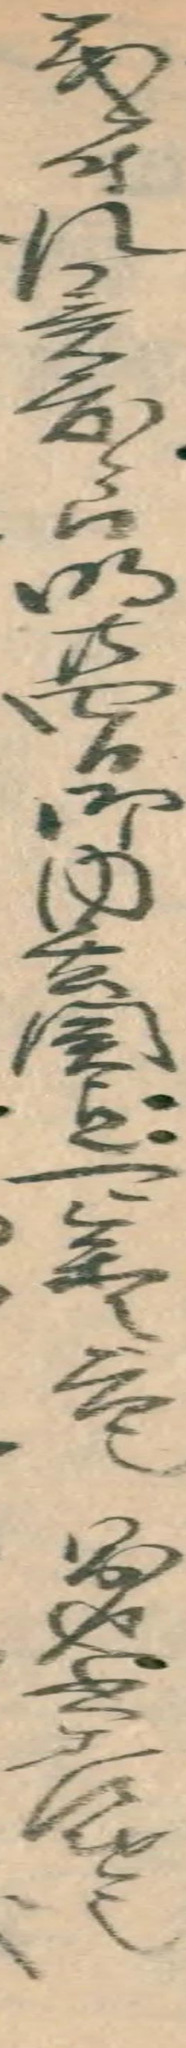義ニ付得御意度候間明廿四日御内玄関迄可参之旨也則返書差遣候也
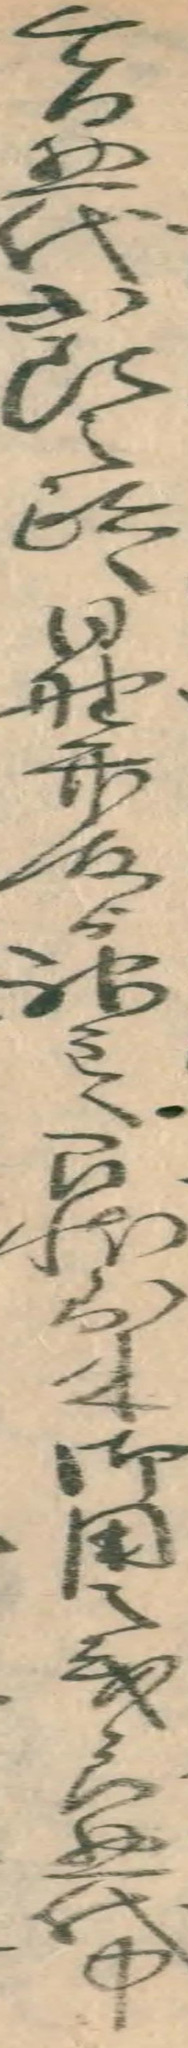一今日惣代出頭之跡へ日野弁殿ゟ神主へ召状到来御用之義候間惣代中
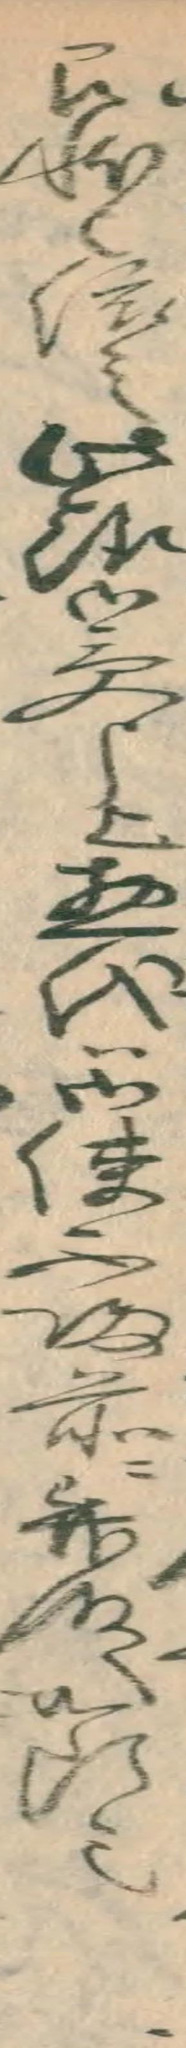召状也依之此趣御受申上惣代ハ御使不帰前ニ弁殿へ出頭也
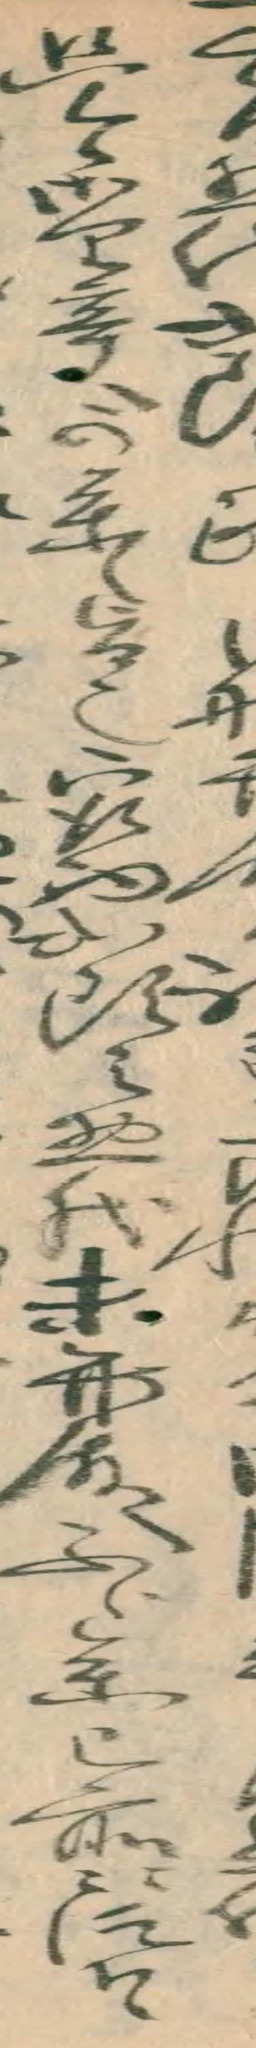只今御里亭へ可参候旨也最初出頭之惣代未弁殿へ不被参已前ニ被仰下候
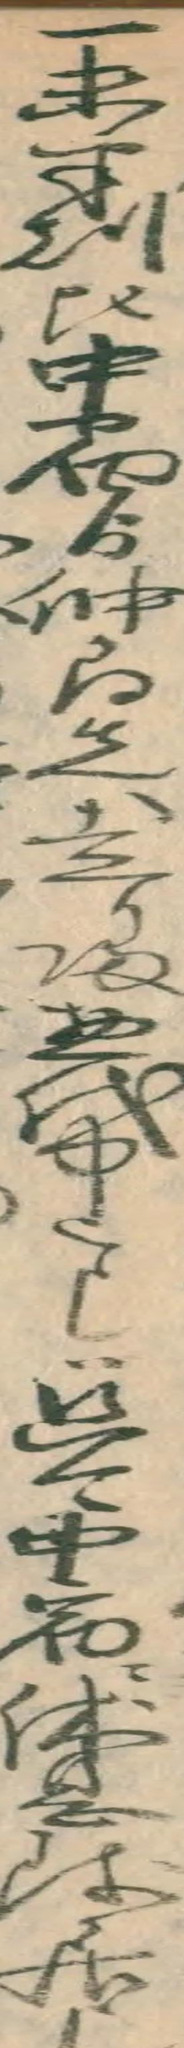一未ノ半刻比中宿ゟ仲間先へ走り帰惣代中迄申候ハ只今中宿ニ休息致居申候
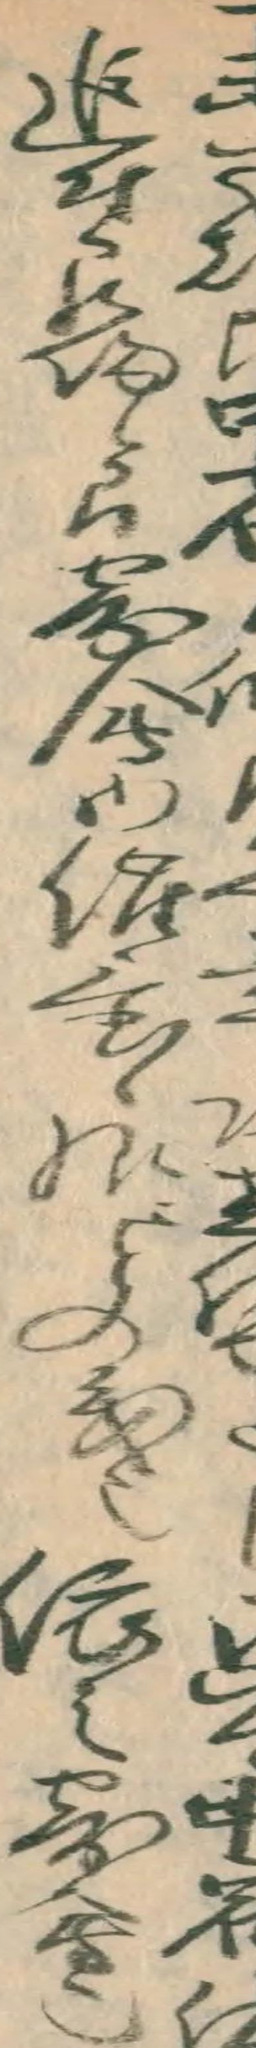追付罷帰候間寄会御催置候様ニとの義也依之寄会也
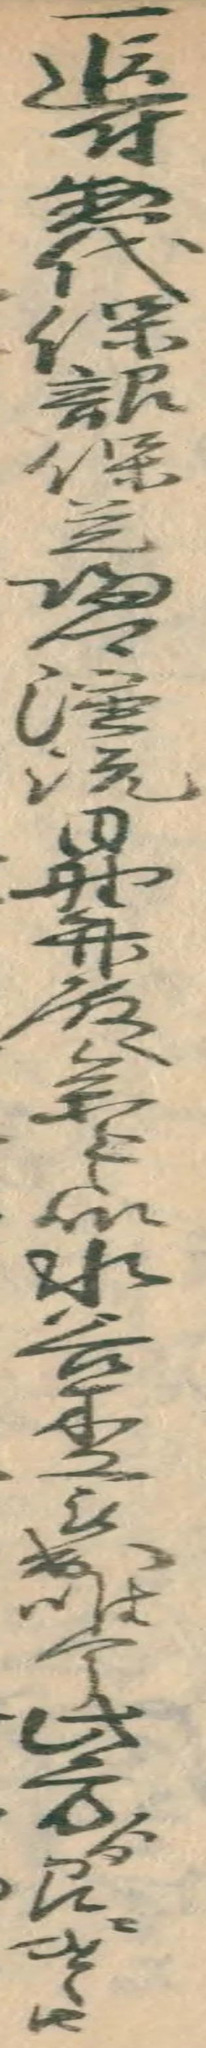一追付惣代保韶保覚帰郷演説日野弁殿へ参上候処水谷木工被出唯今此方ゟ召ニ遣候由
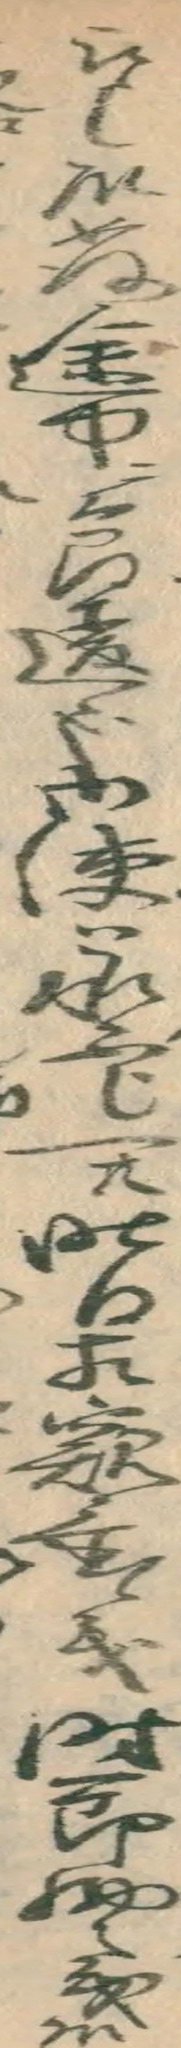被申候故如何途中ニ而間違候哉御使ハ承不申候ヘ共昨日相窺置候義時節柄之義故
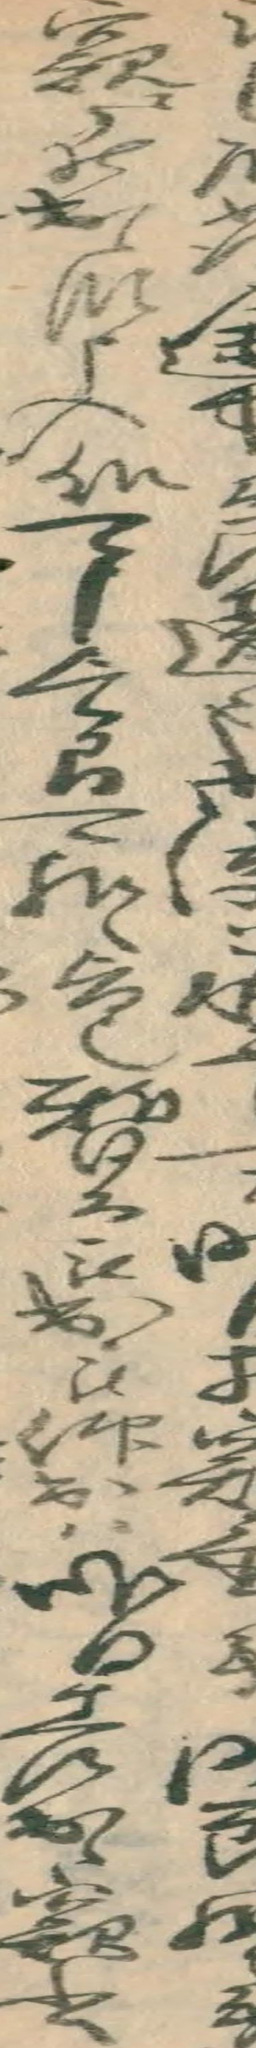窺ニ罷出候段申入処可申上候間可扣候旨也暫而被出被仰出ハ昨日差出候窺書
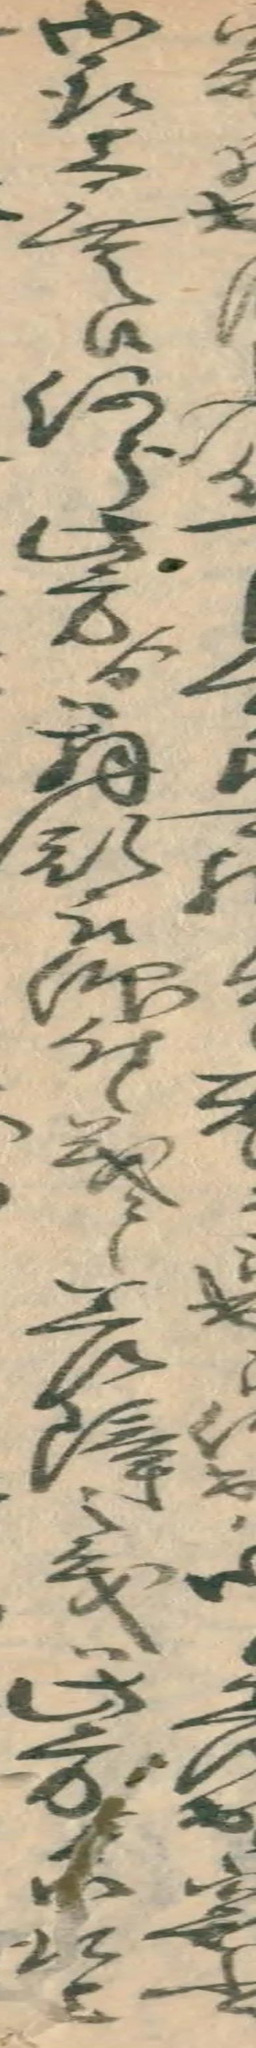御取上無之候何分此方ゟハ拝領被仰付候義ニ候差障之義ハ此方取上
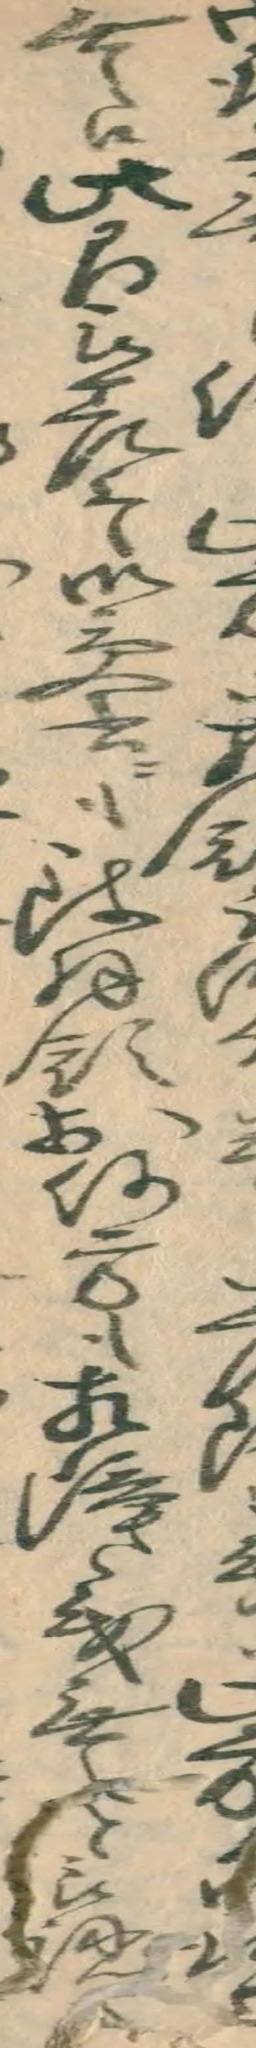無之候此間被差上候御受書ニも致拝領於何方も相障候義無之と被認
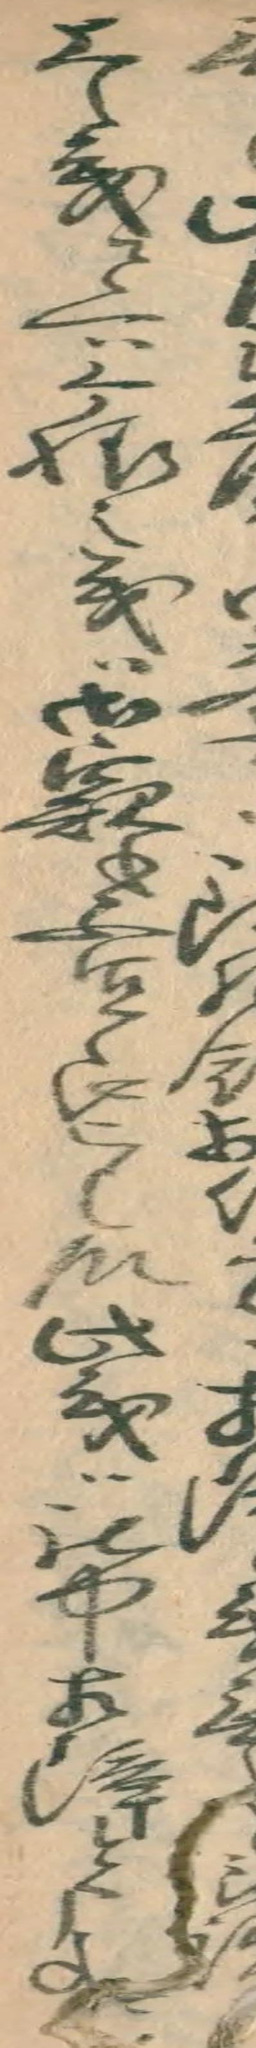上之義ニ候へハケ様之義ハ御窺も不宜候由被申候故此義ハ社中相障と申事ニ

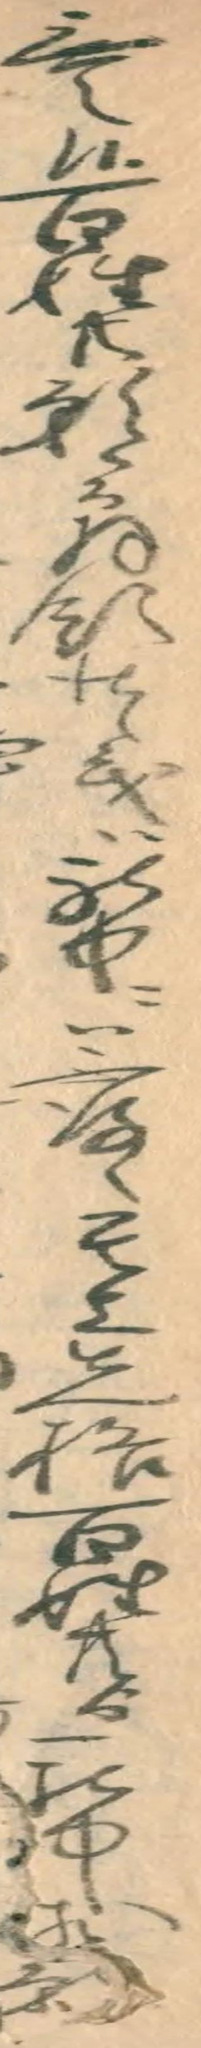無之候百姓共願候而拝領仕候義ハ社中ニハ不存候其上先格百姓共ゟ一社中相願
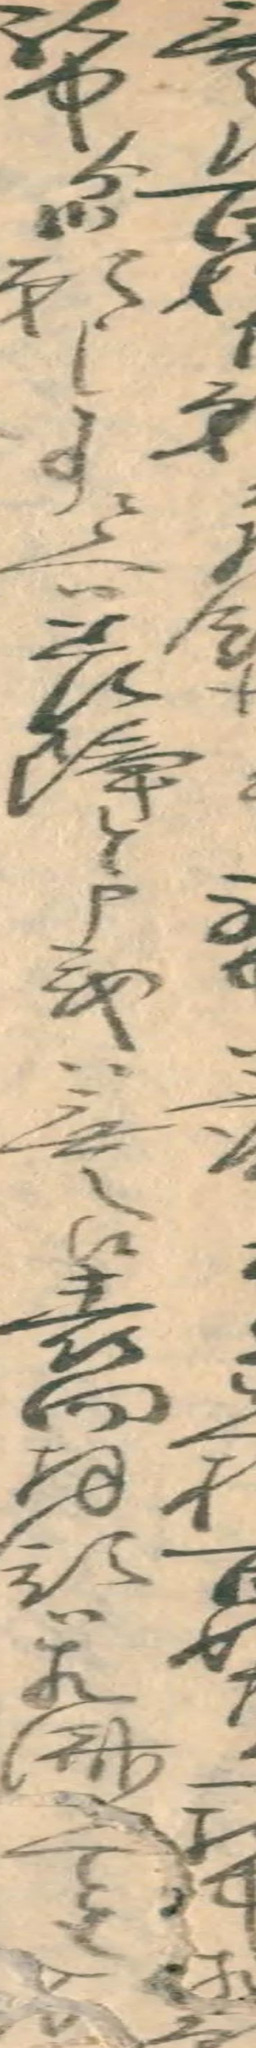社中ゟ御願申候事ニ候へハ差障と申義ハ無之候表向拝領ハ相済候へとも
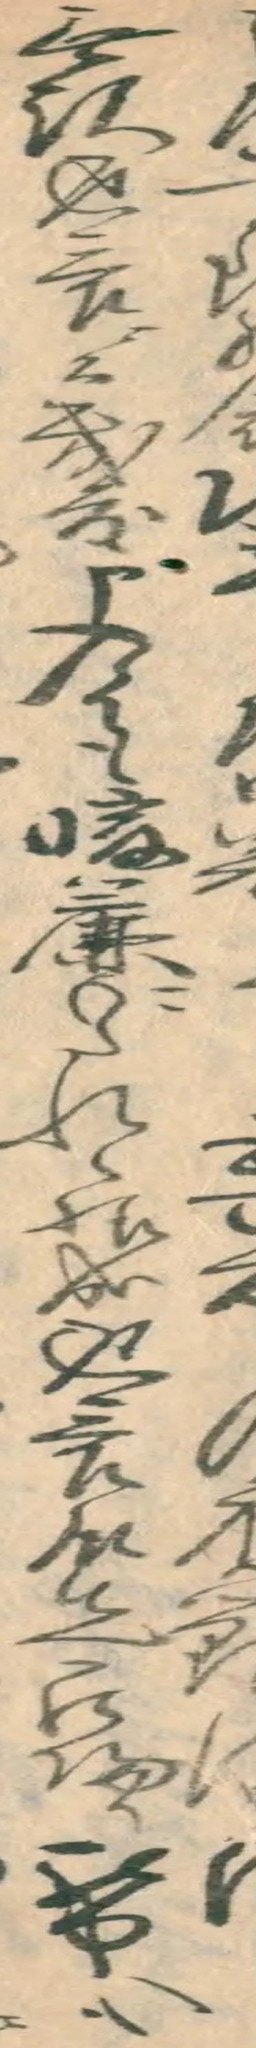無訳返答ニ而幾度申入ても暖廉ニもたれ候様成返答故先罷帰り社中へも
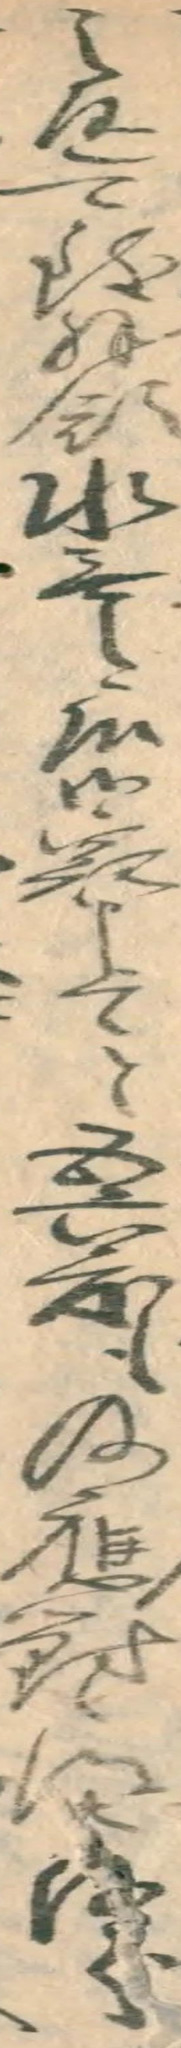之通可致拝領水無之候故御窺申上候と五六度も及応対候得共何分
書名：賀茂社記録. 第58冊
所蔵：国立国会図書館 National Diet Library, JAPAN
